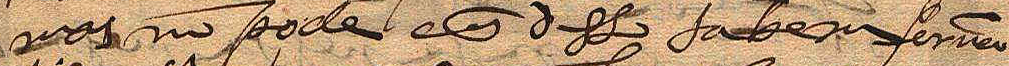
mas nō pode e q̄ disso sabera fernão
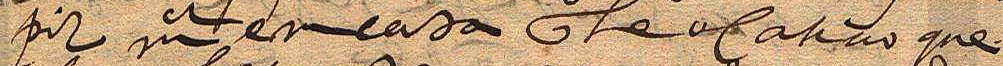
piz mor em ceita q̄ he o Catiuo que
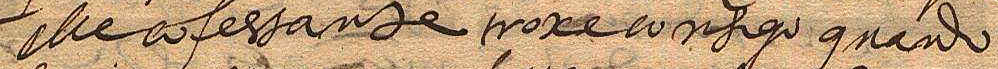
elle cōfessante troxe consigo quando
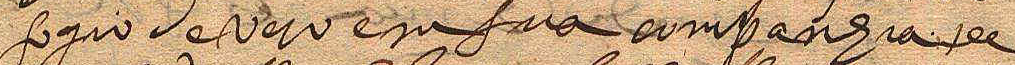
fogio e vejo em sua companhia tee
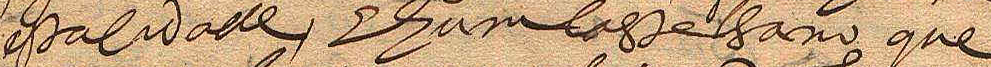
esta Cidade, e hum Castelhano que
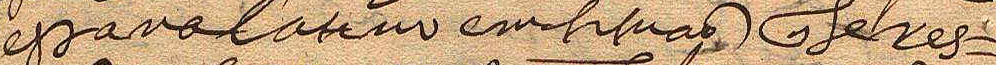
estava Catiuo em tituaõ q̄ se res
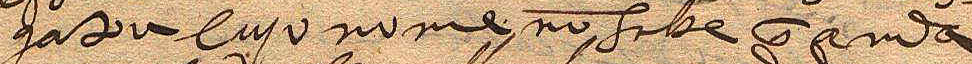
gatou Cujo nome nō sabe q̄ amda
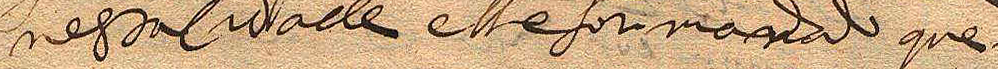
nesta Cidade e lhe foi mandado que
